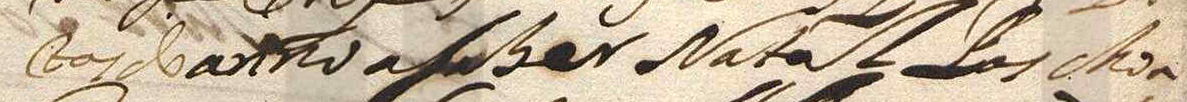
tas do anno a saber Natal Paschoa
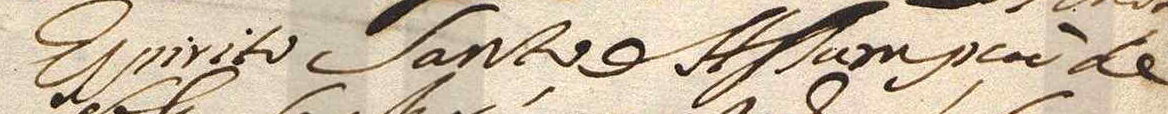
Espirito Santo, e Assumpçaõ de
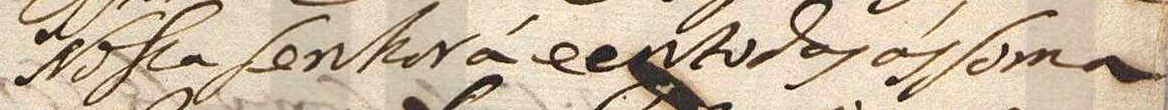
Nossa senhora e en todas as soma
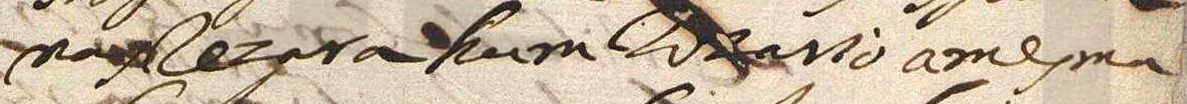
nas Rezara hum Rozario a mesma
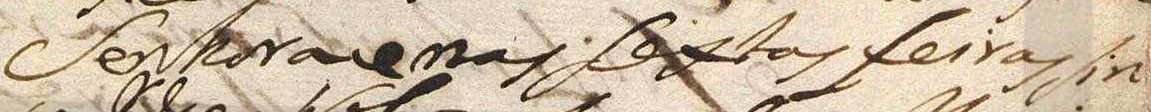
Senhora e nas sextas feiras sin
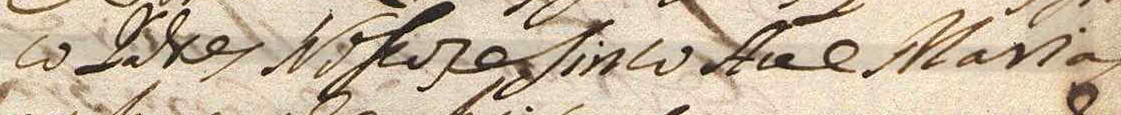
co Padres Nossos e sinco Aue Marias
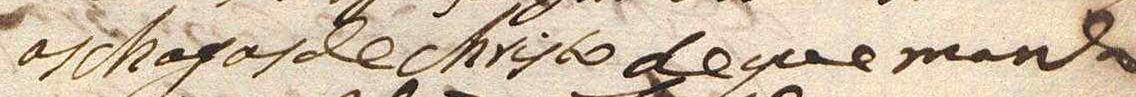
as chagas de christo de que manda
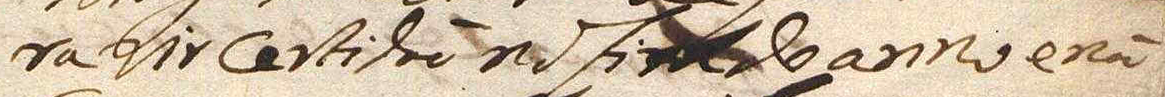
ra vir certidaõ no fim do anno e naõ
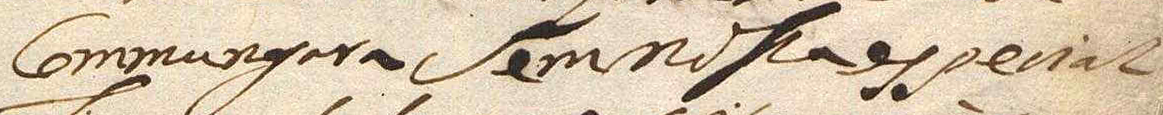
Commungara Sem nossa especial
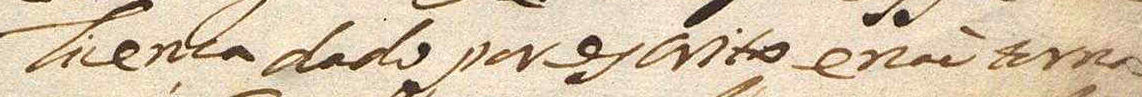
licença dado por escrito e naõ torna
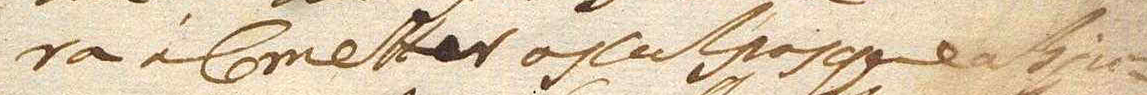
ra a Cometter as culpas que abju
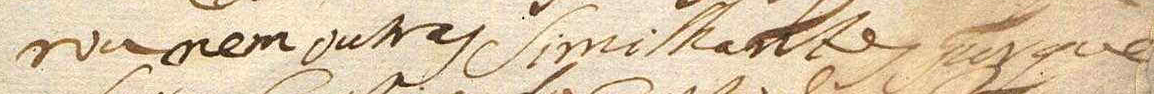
rou nem outras similhantes porque
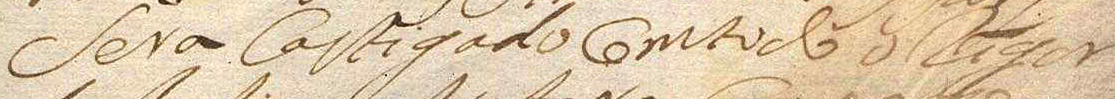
sera Castigado Com todo o Rigor
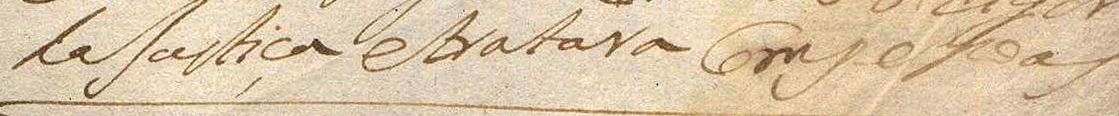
da Justiça e tratara Com pessoas
